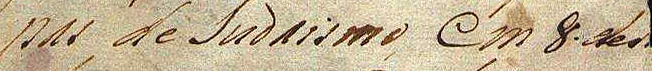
pas de Iudaismo, em 8. de _
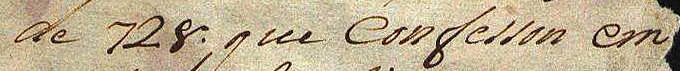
de 728. que confessou em
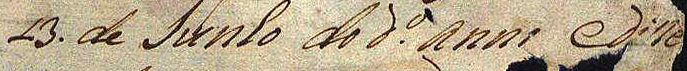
13. de Iunho do d.o anno e disse
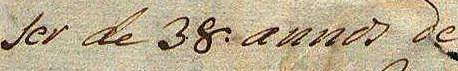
ser de 38. annos de
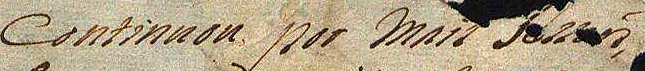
continuou por mais sess_es̄,
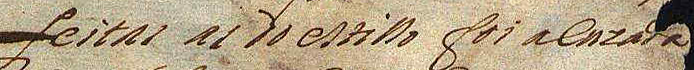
feitas as do estillo foi acuzada
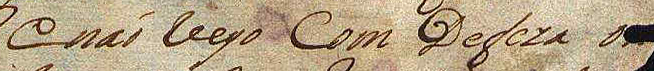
e naõ veyo com Defeza o
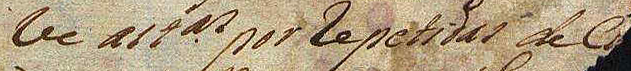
ve as t.as. por Repetidas de c
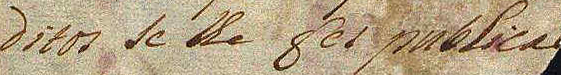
ditos se lhe fes publica
